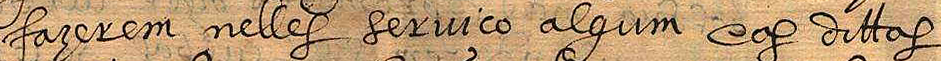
fazerem nelles seruiço algum e as dittas
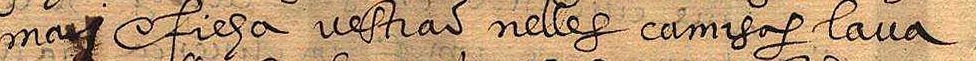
maj e filha uestiaõ nelles camisas laua
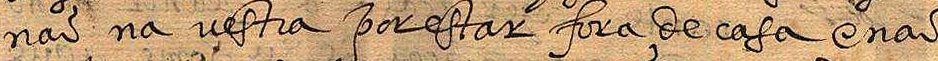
naõ na uestia por estar fora de casa e naõ
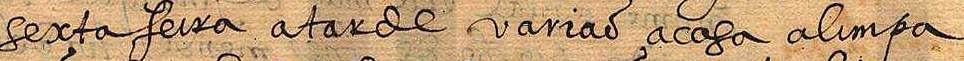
sexta feira a tarde variaõ a casa alimpa
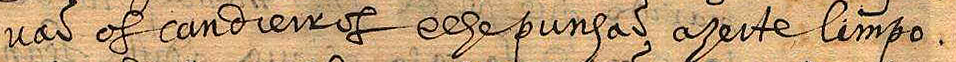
uaõ os candierios e lhe punhaõ azeite limpo.
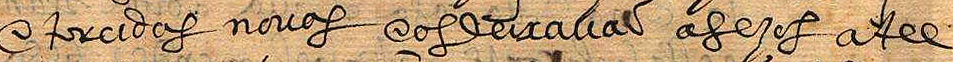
e torcidas nouas e as leixauaõ asezas atee
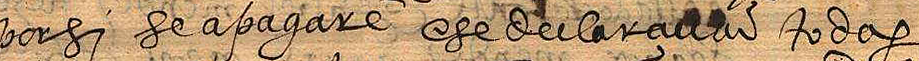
por sj se apagarē e se declarauaõ todas
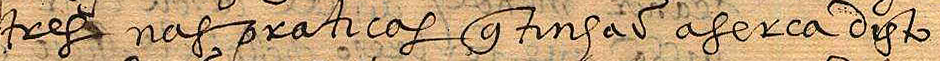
tres nas praticas q̄ tinhaõ aserca disto
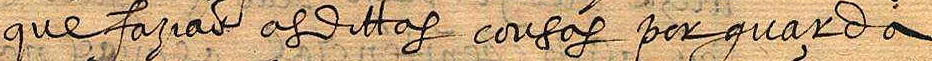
que faziaõ as dittas cousas por guarda
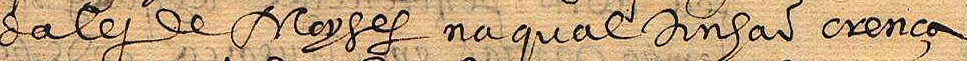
da lej de Moyses na qual tinhaõ crença
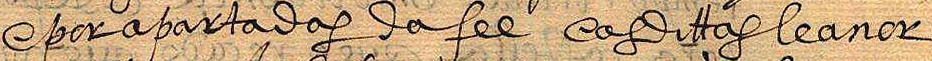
e por apartadas da fee e as dittas leanor
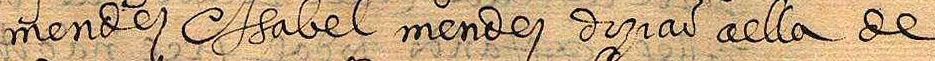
mendez e Jsabel mendez diziaõ a ella de
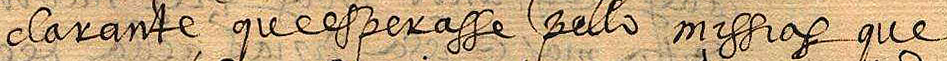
clarante que esperasse pello missias que
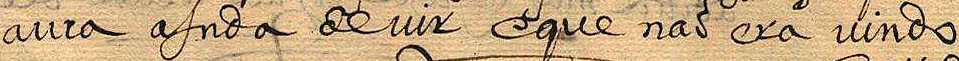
auia aJnda de uir e que naõ era uindo
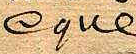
e que
